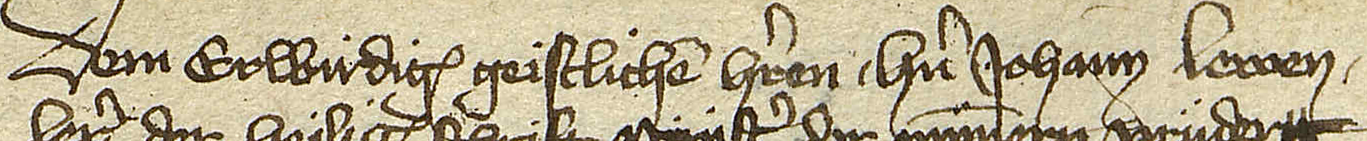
Dem Erwirdig* geiſtliche* hr*en / hn* Iohann lewen /
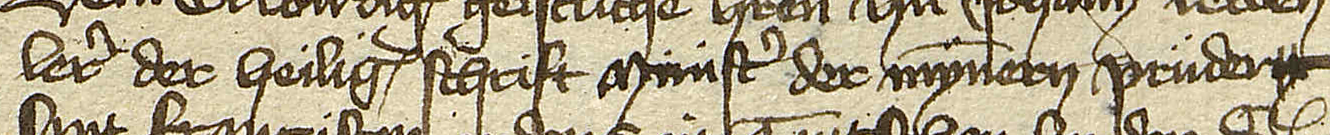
ler* der heilig* ſchrift Miniſt* der my*nern prüdern
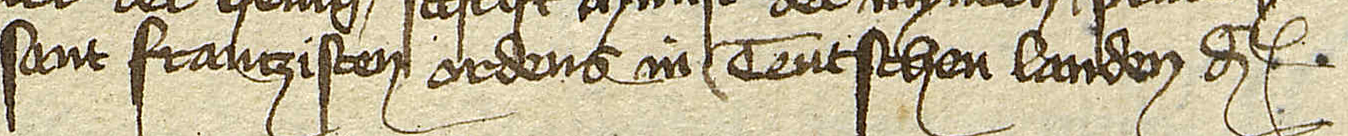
ſant Francʒiſcen ordens in Teutſchen landen d* %
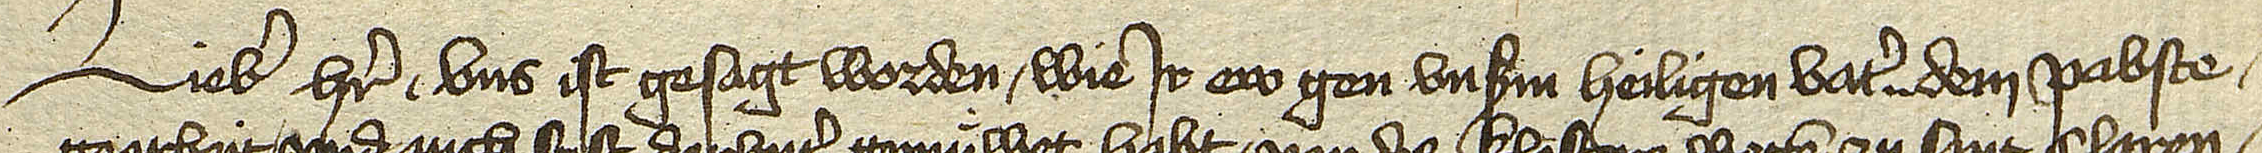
Lieb*hr* / vns iſt geſagt worden / wie Ir ew gen vnſ*m heiligen vat* ~ dem Pabſte /
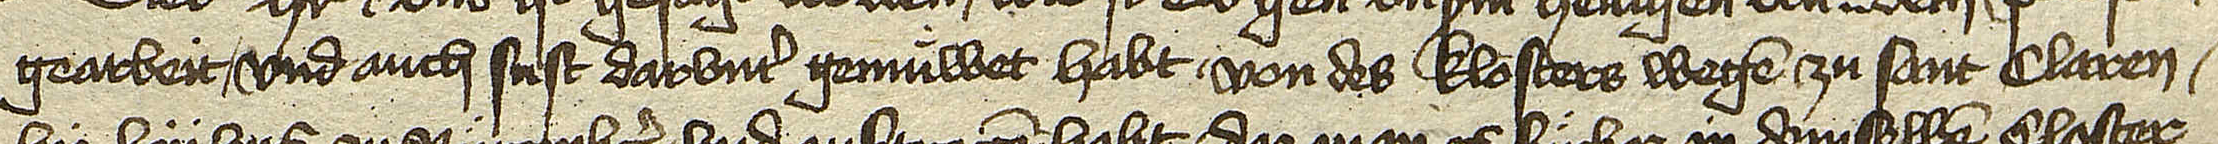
gearbeit / vnd auch ſuſt darvnt* gemüwet habt / von des kloſters wege* cʒu ſant Claren /
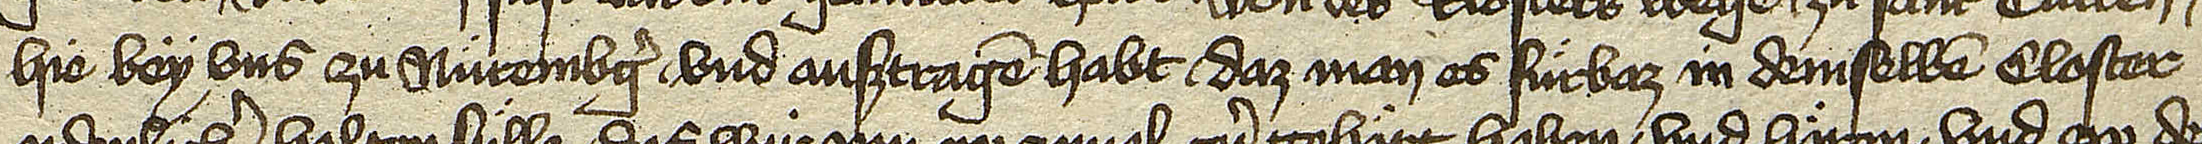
hie bey vns cʒu Nürembg* / vnd auſʒtrage* habt / daʒ man es fürbaʒ in demſelbe* Cloſter
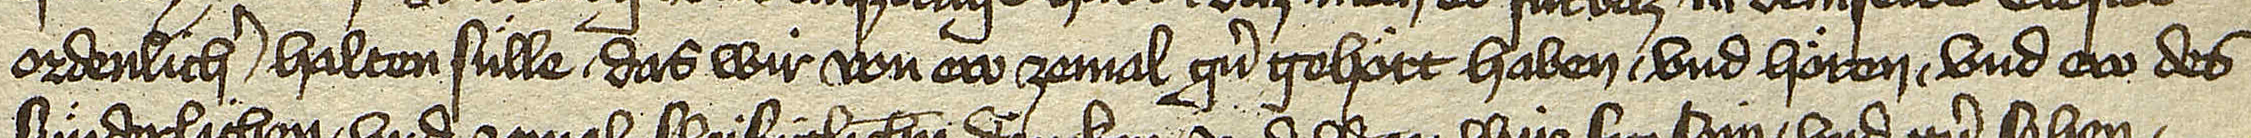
ordenlich* halten ſülle / das wir von ew cʒemal gn* gehört haben / vnd hören / vnd ew des
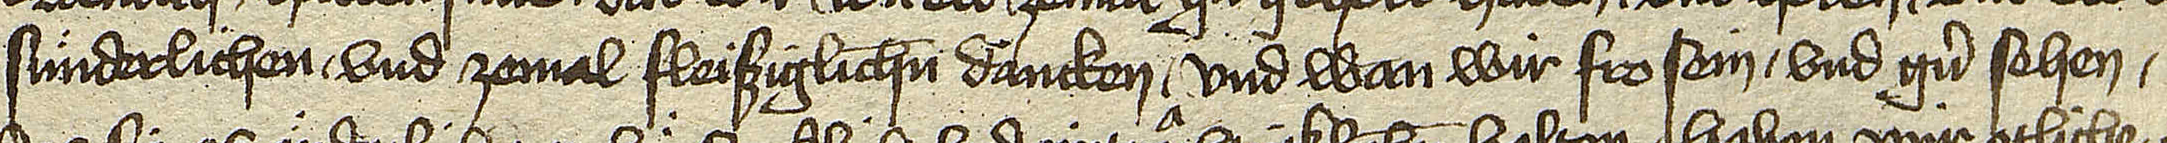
ſünderlichen / vnd cʒemal fleiſʒiglichn* dancken / vnd wan wir fro ſein / vnd gn* ſehen /
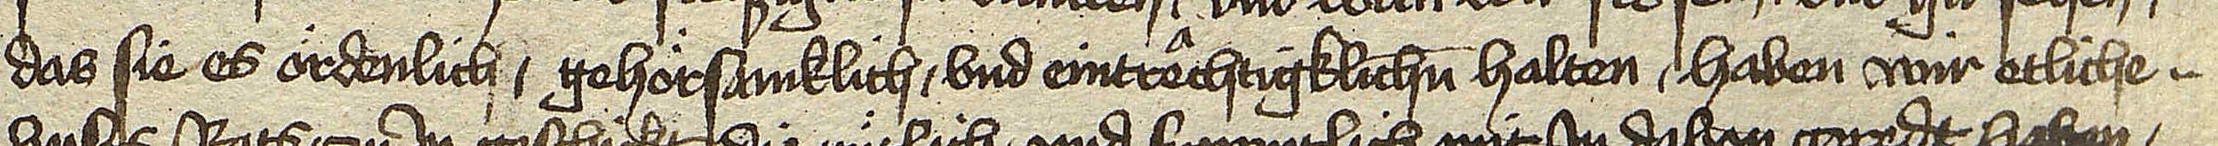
das ſie es ördenlich / gehörſamklich / vnd eintrëchtigklichn* halten / haben wir etliche ~
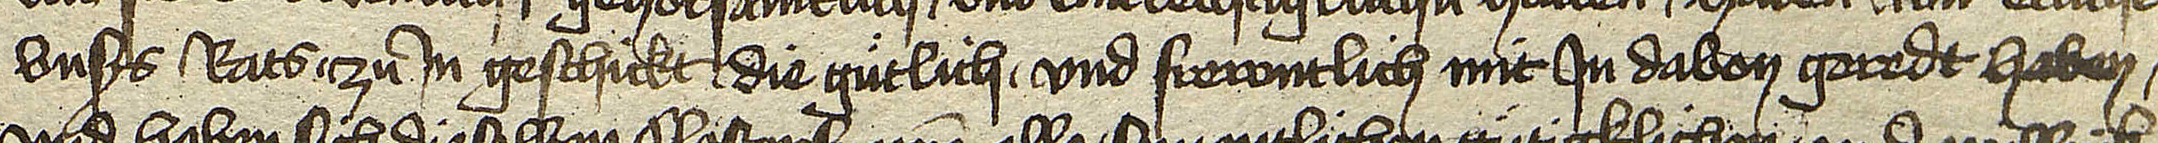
vnſ*s Rats / cʒu In geſchickt / die gütlich / vnd frewntlich mit In davon geredt haben /
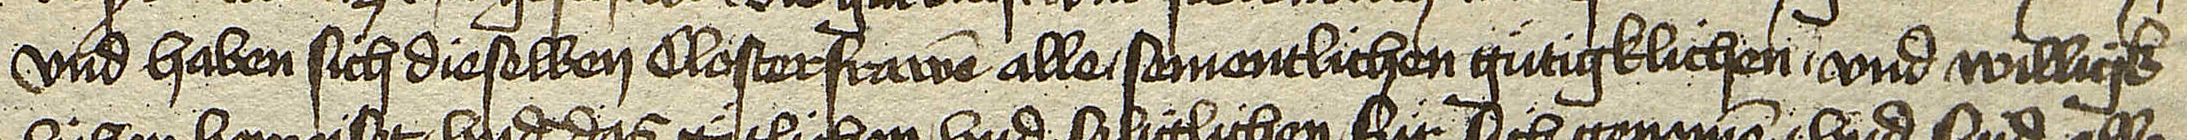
vnd haben ſich dieſelben Cloſterfrawe* alle / ſementlichen gütigklichen / vnd willigk
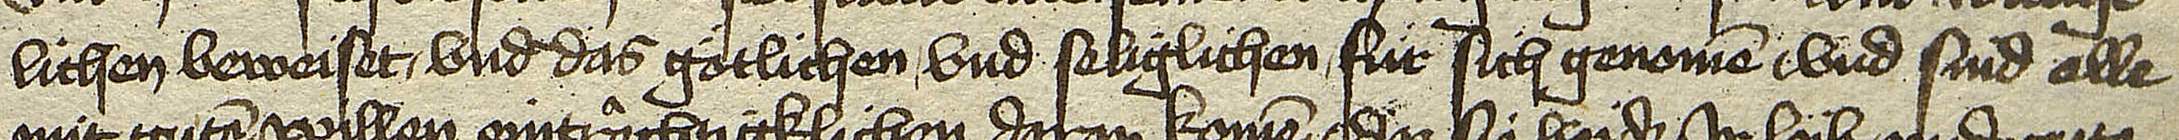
lichen beweiſet / vnd das götlichen / vnd ſeliglichen für ſich genome* / vnd ſind alle
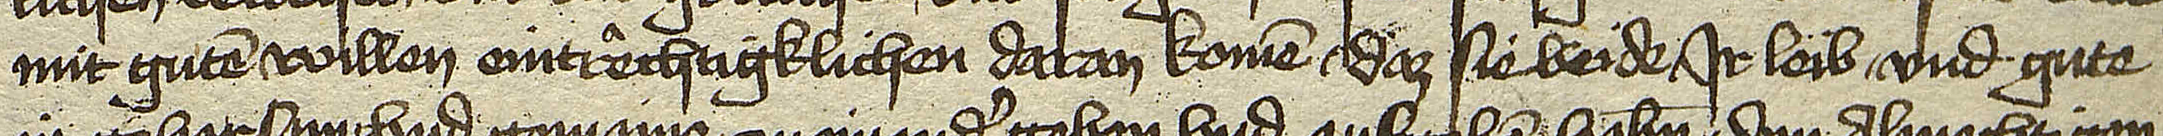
mit gute* willen eintrëchtigklichen daran kome* / daʒ ſie beide / Ir leib / vnd gute
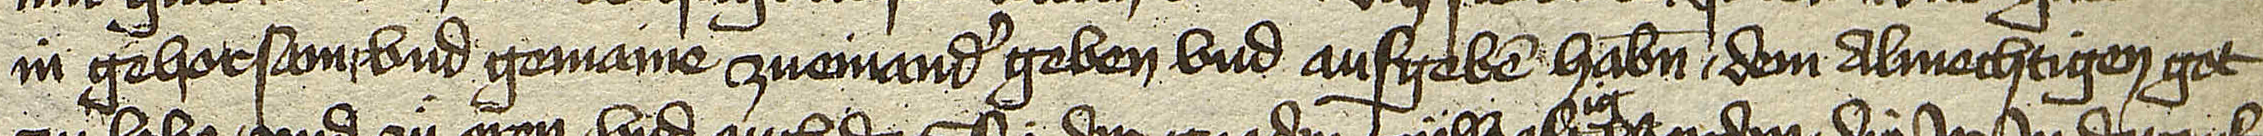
in gehorſam / vnd gemaine cʒueinand* geben vnd aufgebe* habn* / dem Almechtigen got
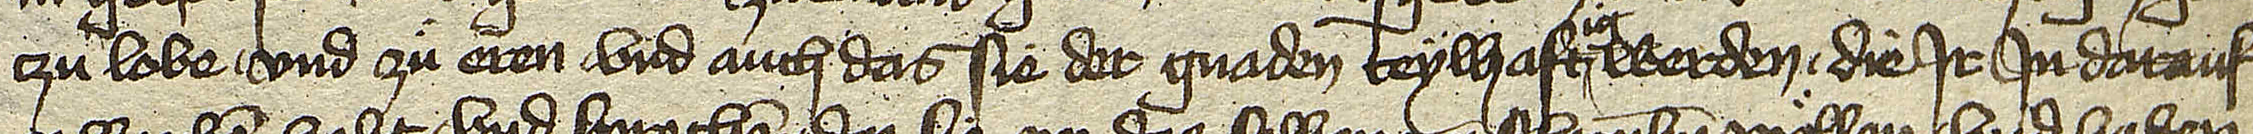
cʒu lobe / vnd cʒü eren / vnd auch das ſie der gnaden teylhaft werden / die Ir In darauf
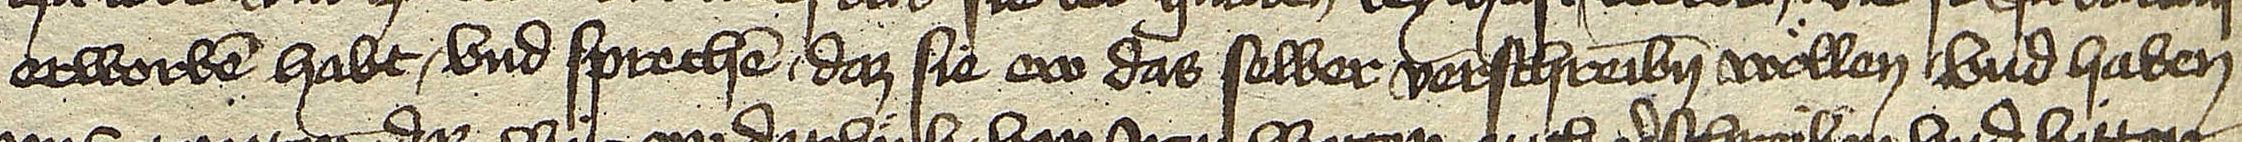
erworbe* habt / vnd ſpreche* / daʒ ſie ew das ſelber verſchreibn* wöllen / vnd haben
